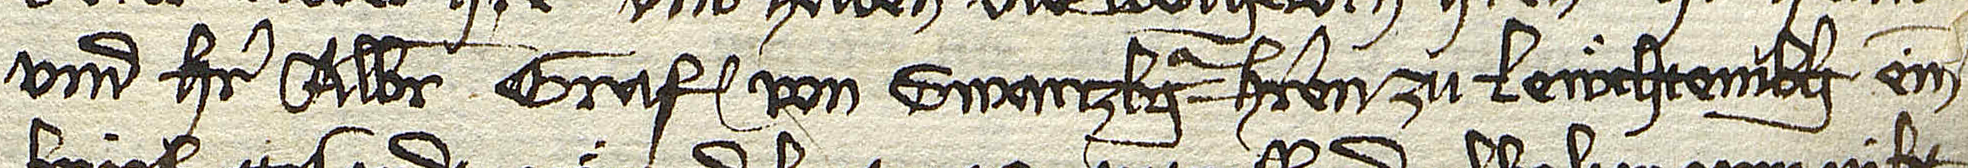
vnd h*r Albr* Graf* von Swarcʒbg* h*ren ʒu Leẅchtembg* ein*
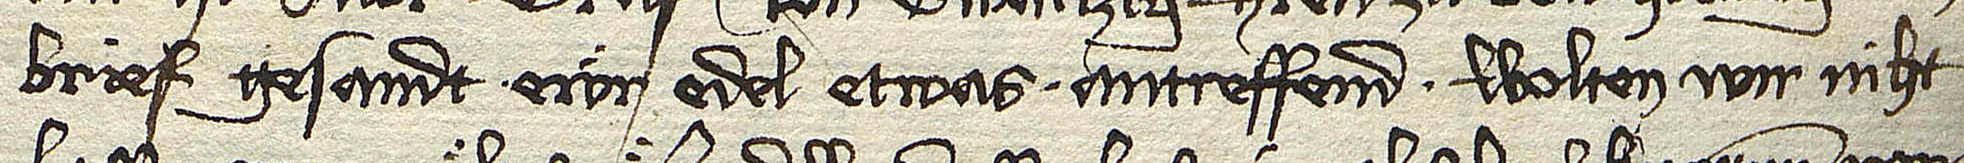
brief geſandt . eẅr edel etwas . antreffend . Wolten wir niht
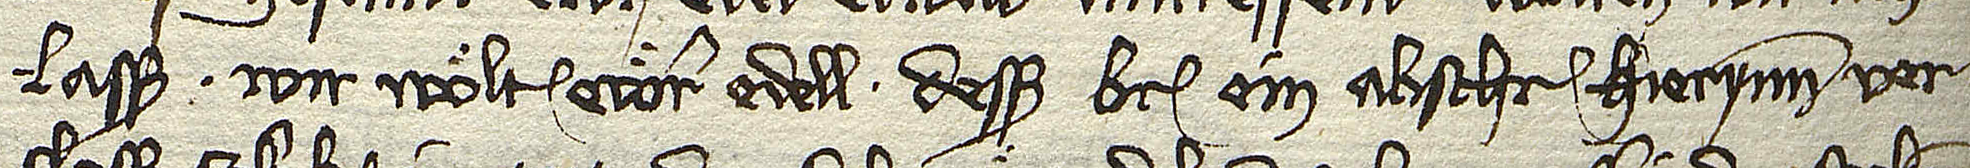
laſſ* . wir wölt* eẅr edell . deſſ* br* ein abſchr* hierynn* ver =
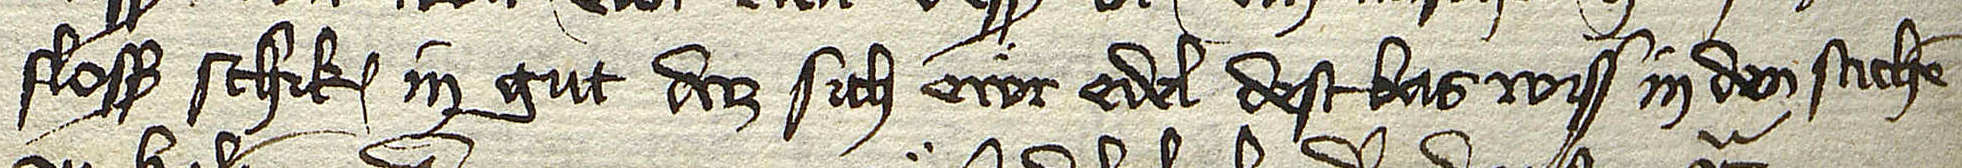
ſloſſ* ſchik* in gut daʒ ſich eẅr edel deſt bas wiſſ in den ſache*
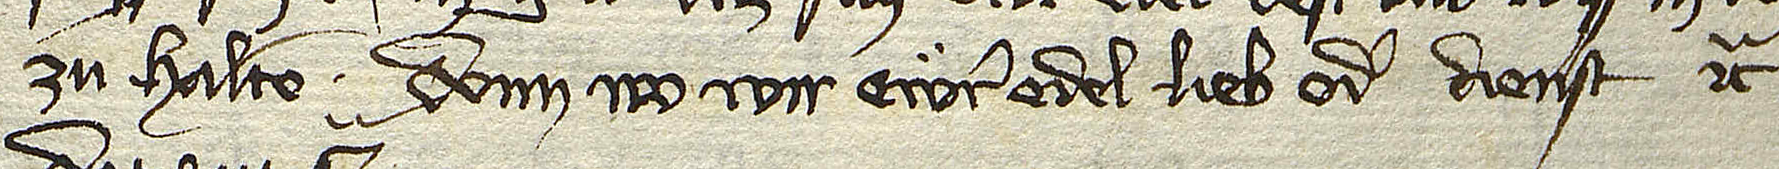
ʒu halte* . Denn wo wir eẅr* edel lieb od* dienſt ec*
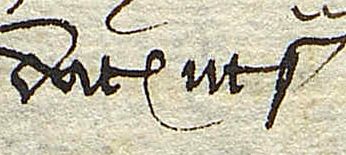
Dat* ut ſ*
